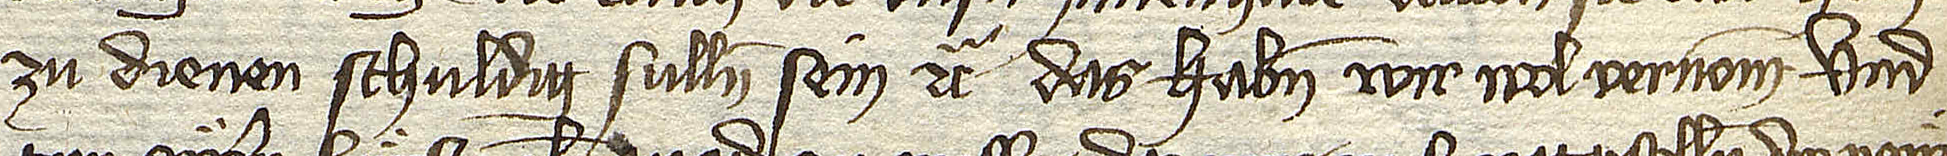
ʒu dienen ſchuldig ſulln* ſein ec* das habn* wir wol vernom* Vnd
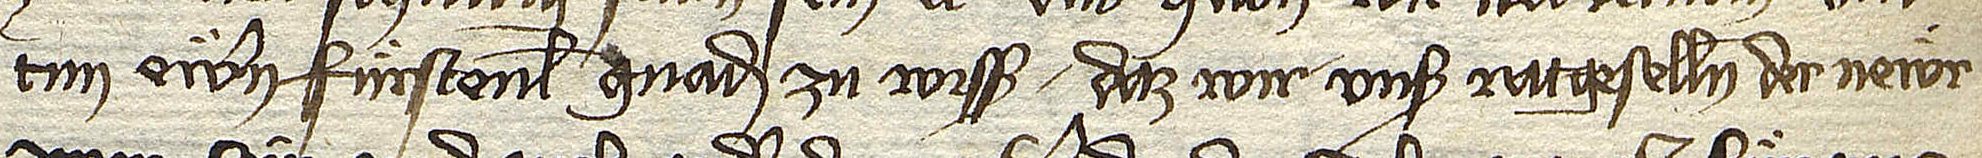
tun eẅ*n fürſtenl* gnad* ʒu wiſſ* / daʒ wir vnſ* ratgeſelln* der neẅr
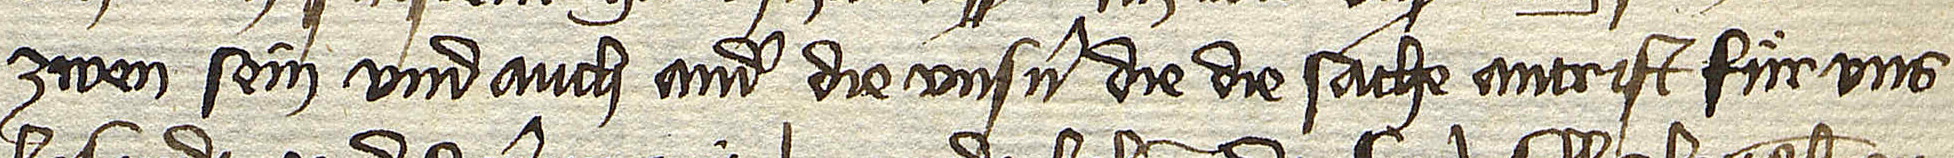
ʒwen ſein vnd auch and* die vnſn* die die ſache antrift für vns
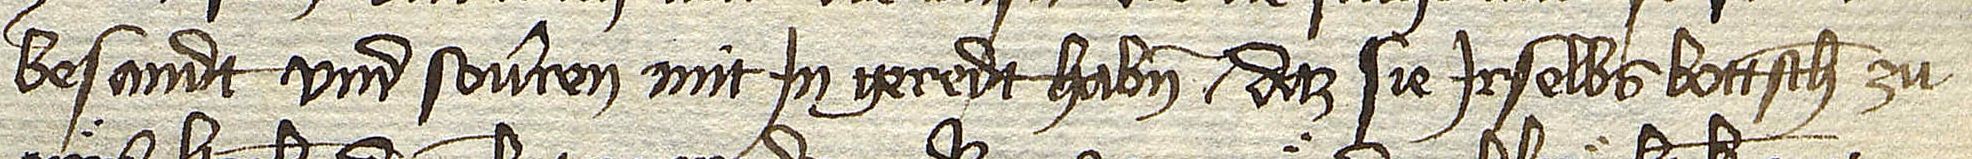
beſandt vnd ſou*ren mit In geredt habn* / Daʒ ſie Irſelbs bottſch* ʒu
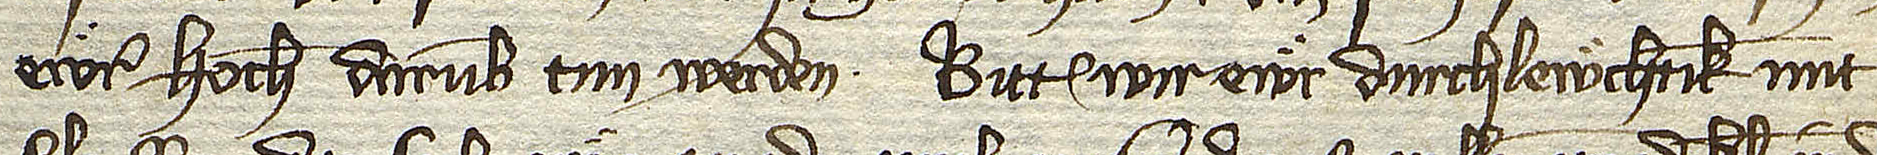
eẅr* Hoch* darub* tun werden . Bitt* wir eẅr durchleẅchtik* mit
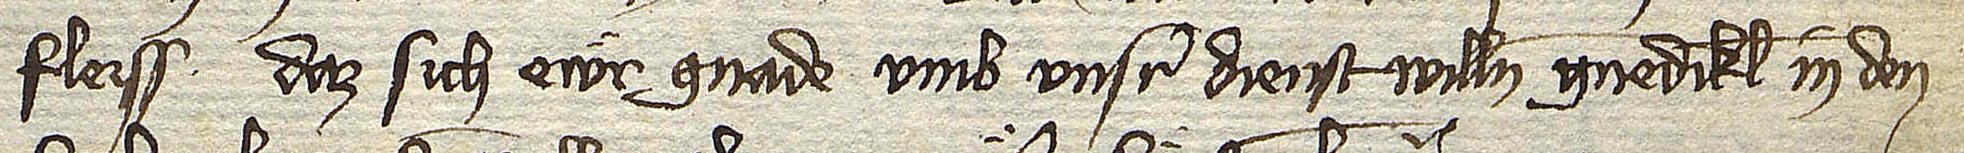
fleiſſ . daʒ ſich eẅr gnade vmb vnſr* dienſt willn* gnedikl* in den
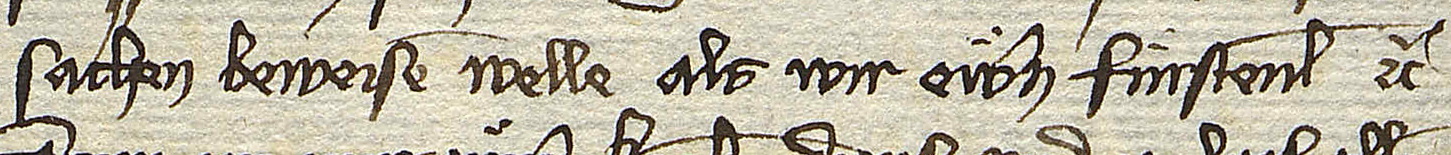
ſachen beweiſe* welle als wir eẅ*n fürſtenl* ec*
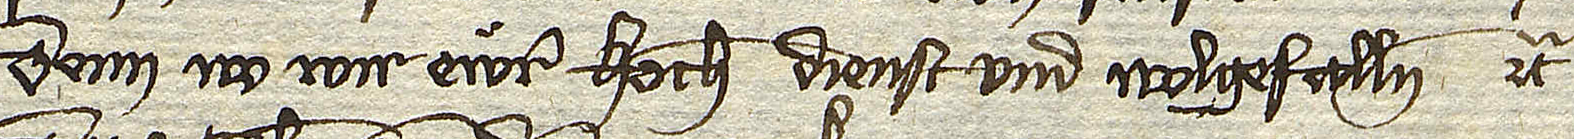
Denn wo wir eẅr* hoch* dienſt vnd wolgefalln* ec*
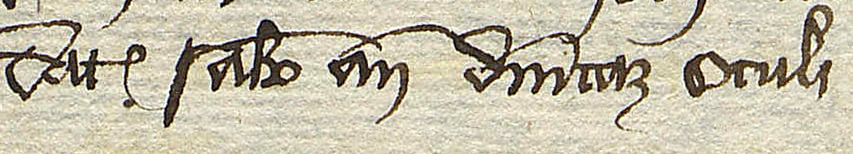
Dat* ſabo* an* d*nica* Oculi
